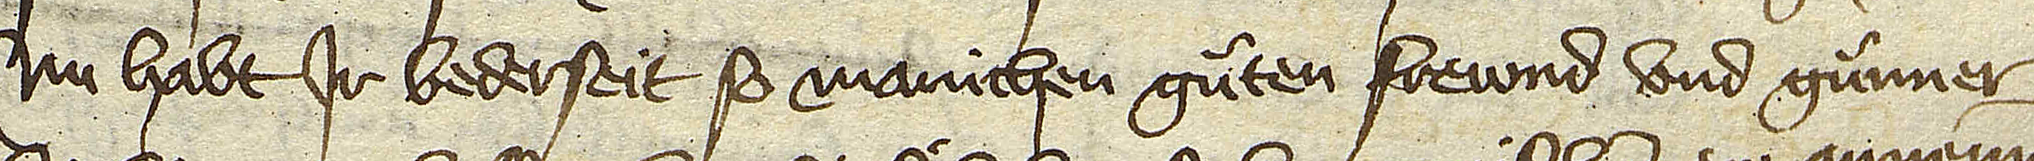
Nu habt Ir bederſeit ſo manichen güten frewnd vnd günner
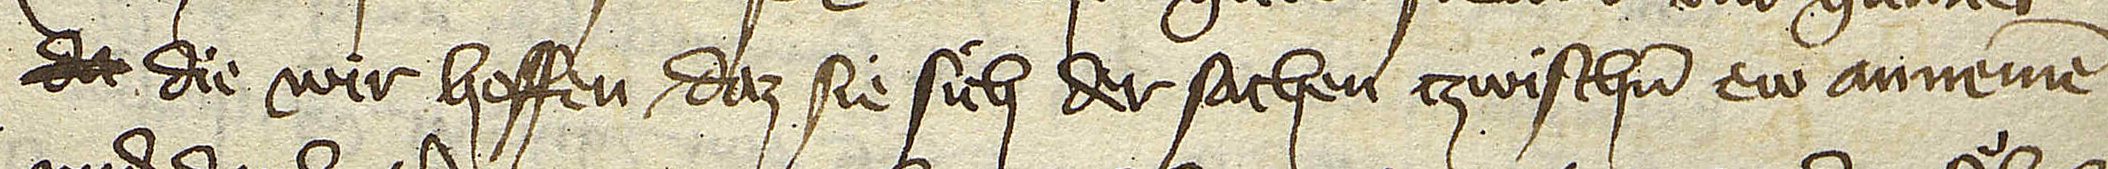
da die wir hoffen / daʒ ſie ſich der ſachen cʒwiſchn* ew anneme*
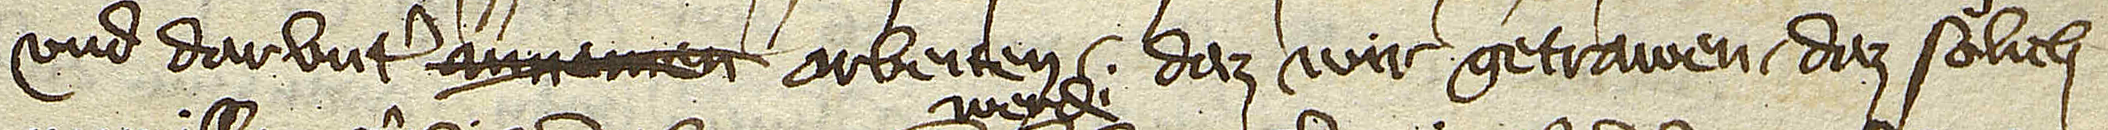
vnd darvnt* annemen arbeiten / . daʒ wir getrawen / daʒ ſölich
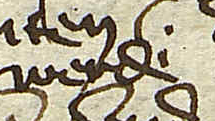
werde
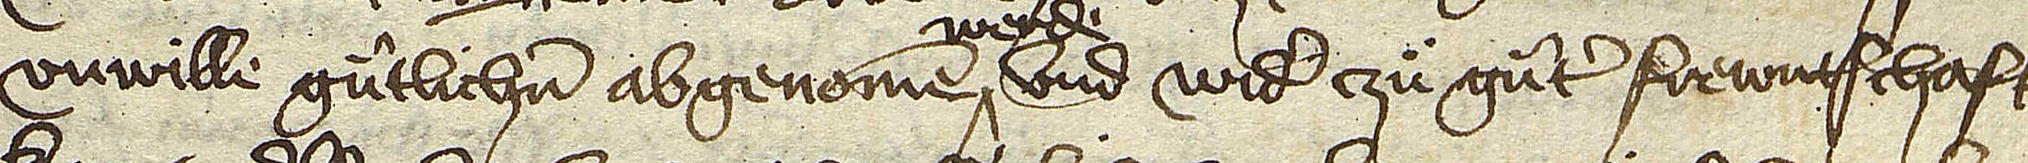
vnwille gütllichn* abgenome* vnd wid* cʒü güt* frewntſchaft
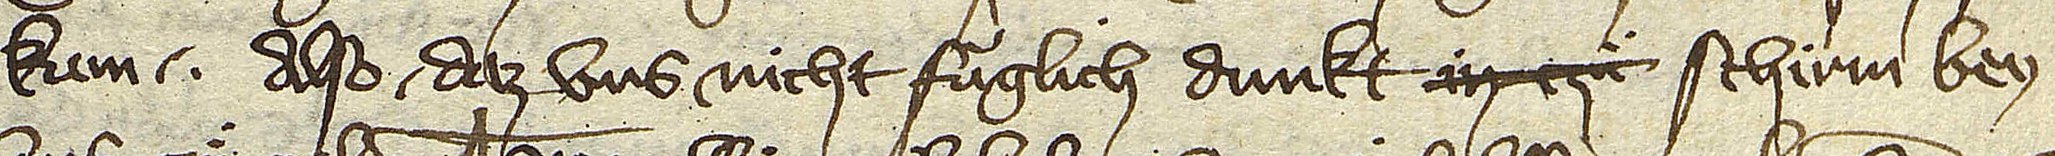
kum / . Alſo / daʒ vns nicht füglich dunkt in cʒü ſchirm bey
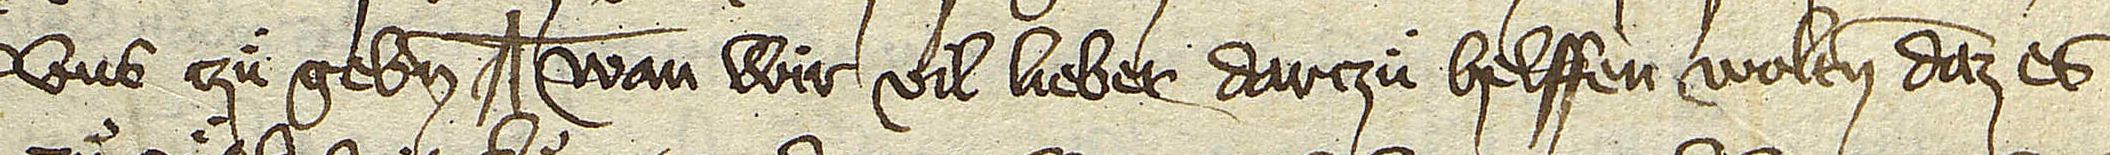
vns cʒü gebn* / wan wir vil lieber darcʒü helffen woltn* daʒ es
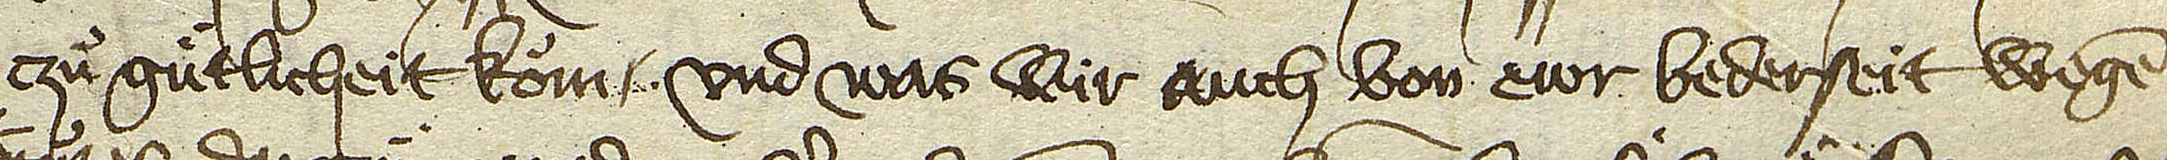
cʒü gütlicheit köm / . vnd was wir auch von ewr bederſeit wege*
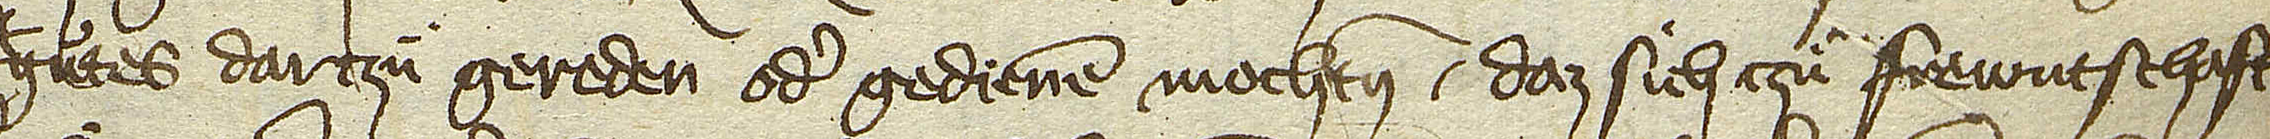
gütes darcʒü gereden od* gediene* mochtn* / daʒ ſich cʒü frewntſchaft
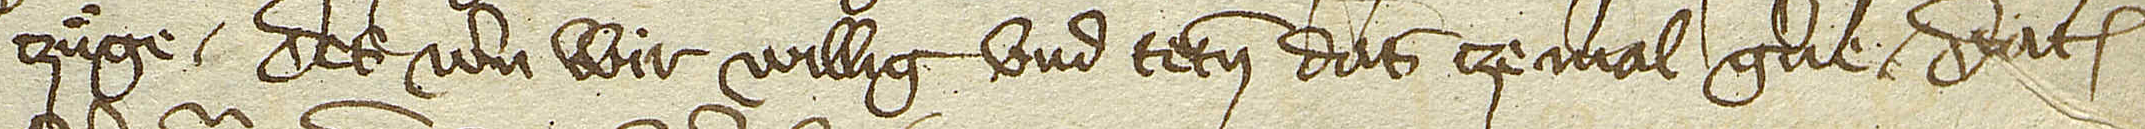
cʒüge / Des w*n wir willig vnd tetn* das cʒemal g*ne / Dat*
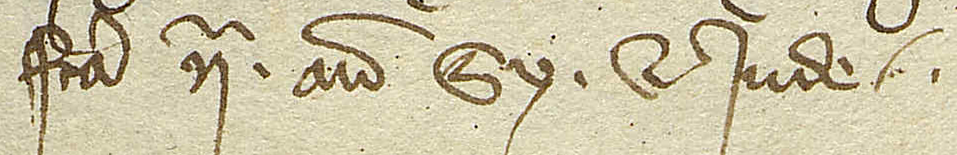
fia* ii* . an* Sy . @ Iude / .
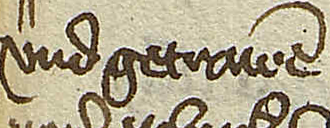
vnd getrawe*
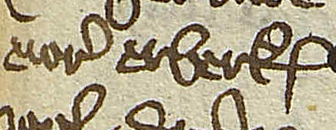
ewr* erberk*
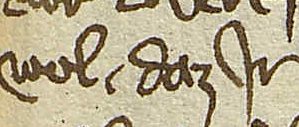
wol / daʒ Ir
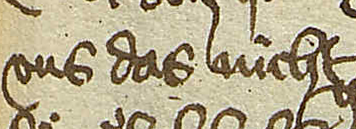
vns das nicht
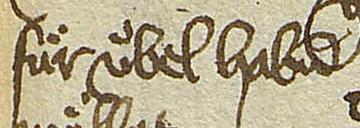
für bel habn*
